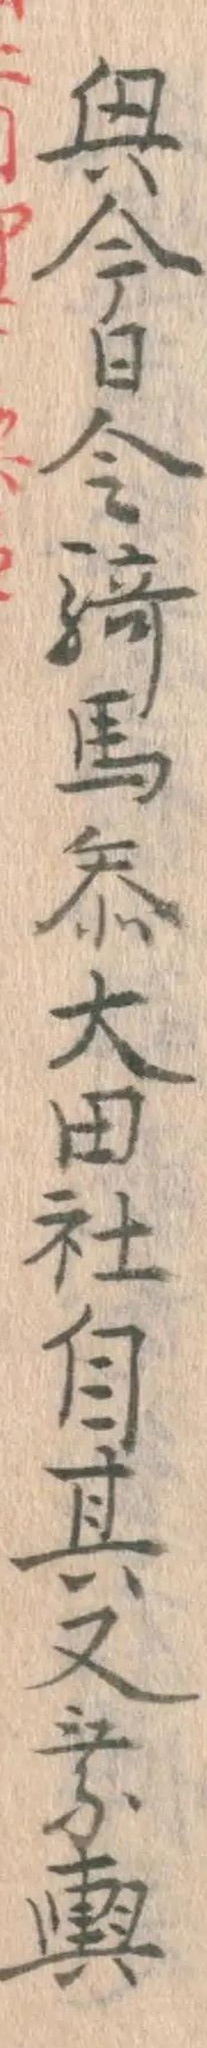興今日令騎馬参大田社自其又乗輿
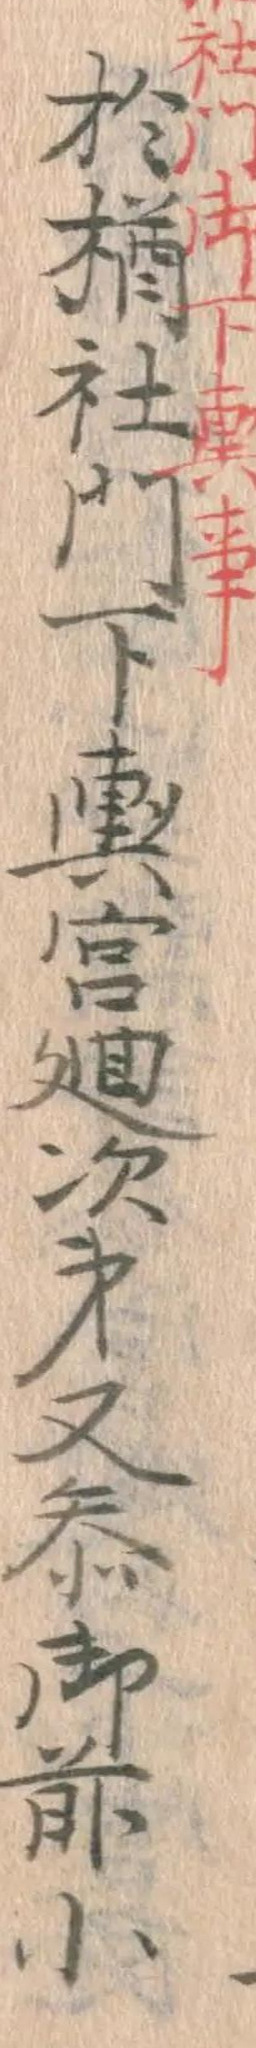於猶社門下輿宮廻次第又参御前小
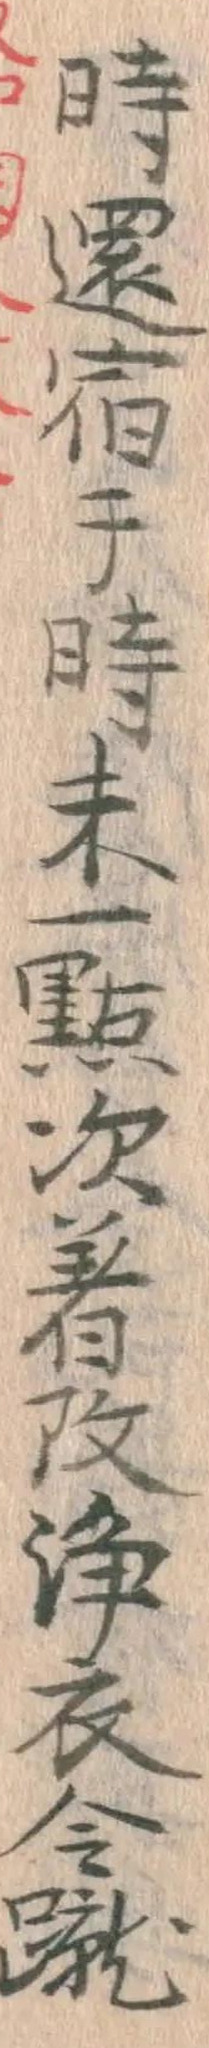時還宿于時未一点次着改浄衣令蹴
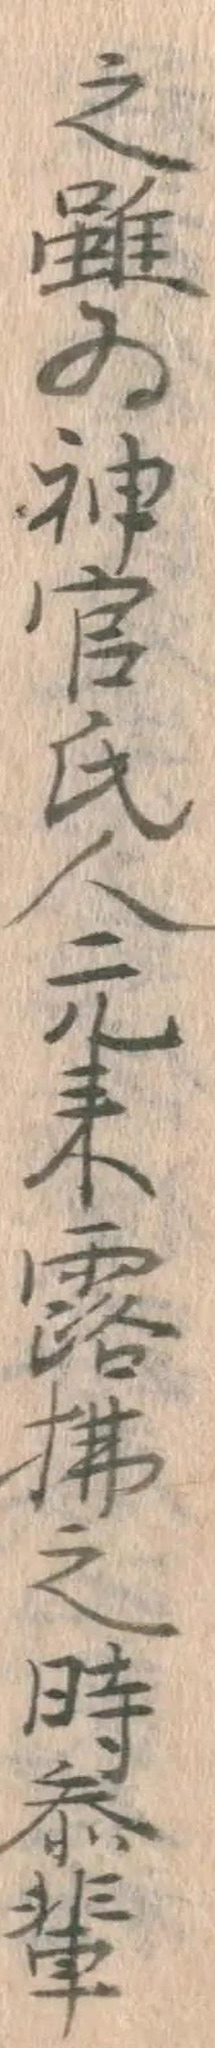之雖為神官氏人元来露払之時参輩
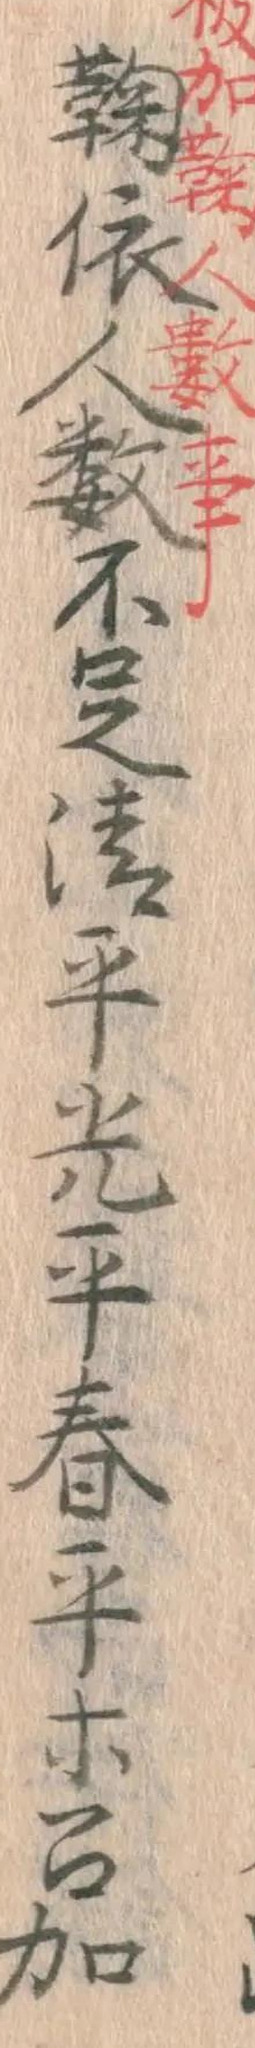鞠依人数不足清平光平春平等召加
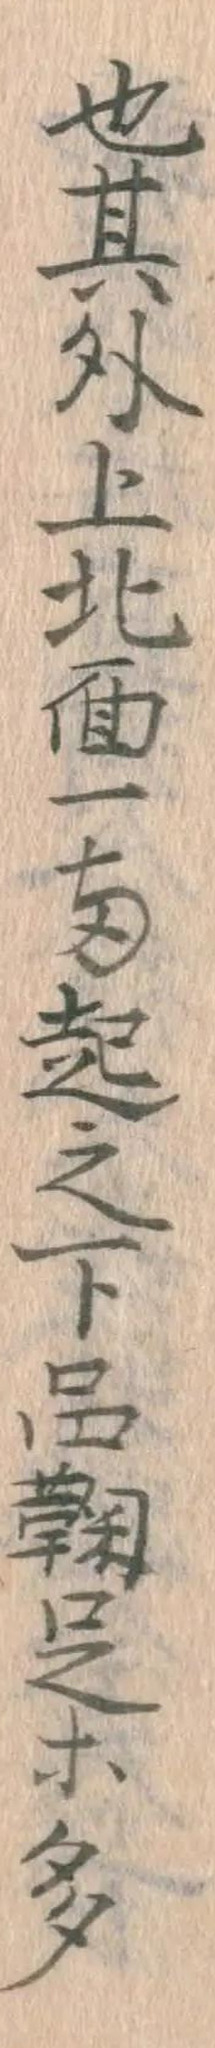也其外上北面一両起之下品鞠足等多
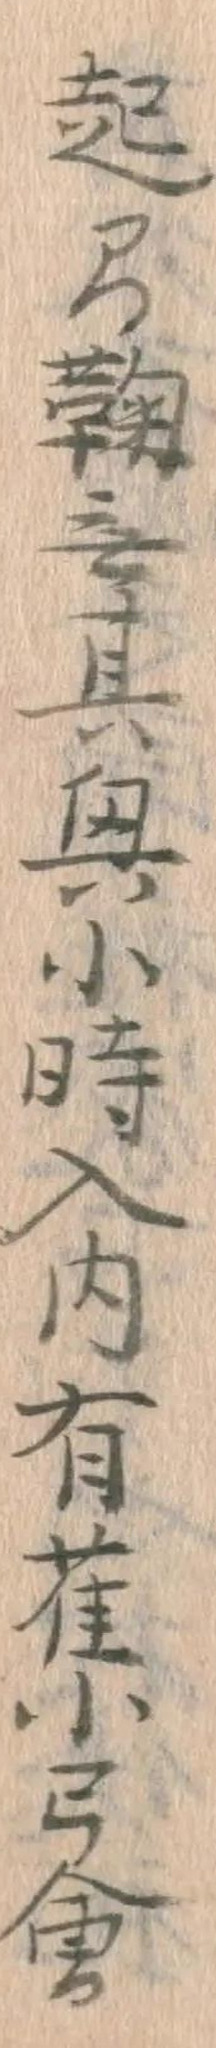起間鞠無其興小時入内有雀小弓会
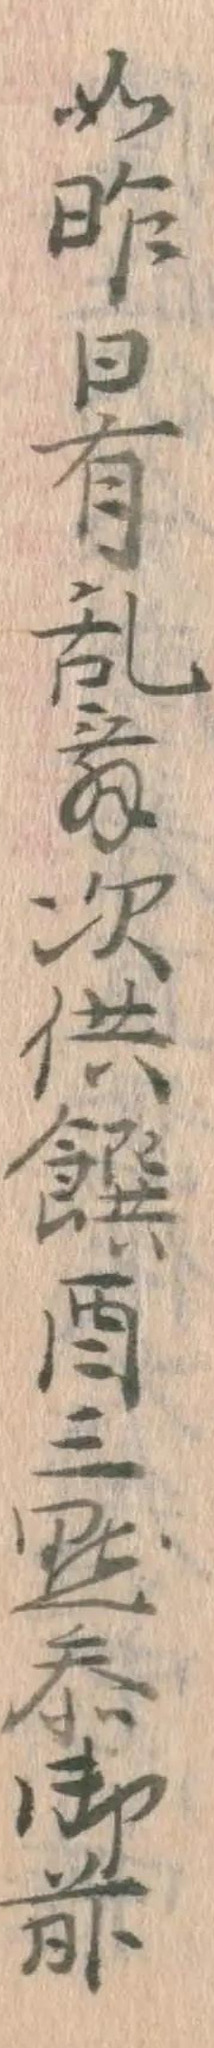如昨日有乱舞次供饌酉三点参御前
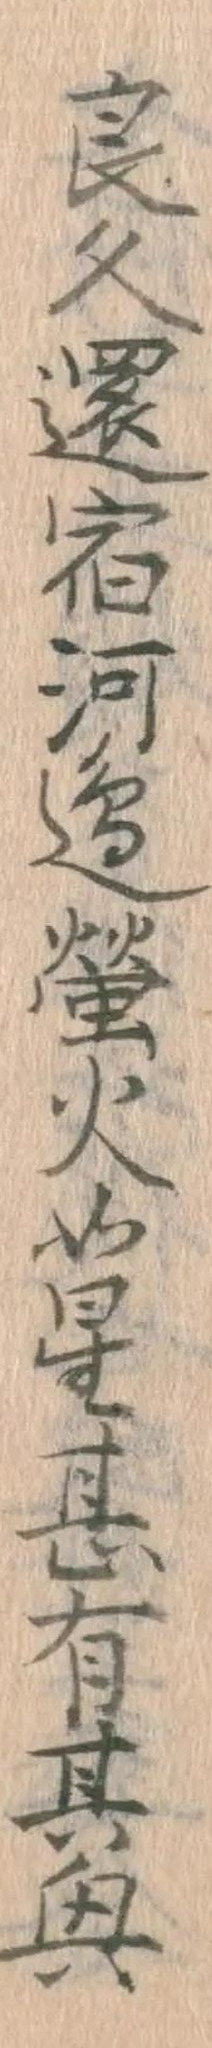良久還宿河辺蛍火如星甚有其興
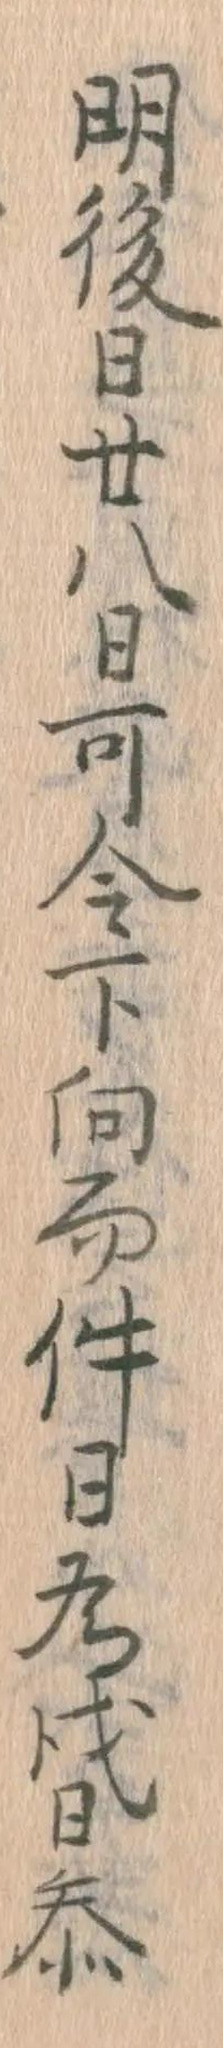明後日廿八日可令下向而件日為戌日参
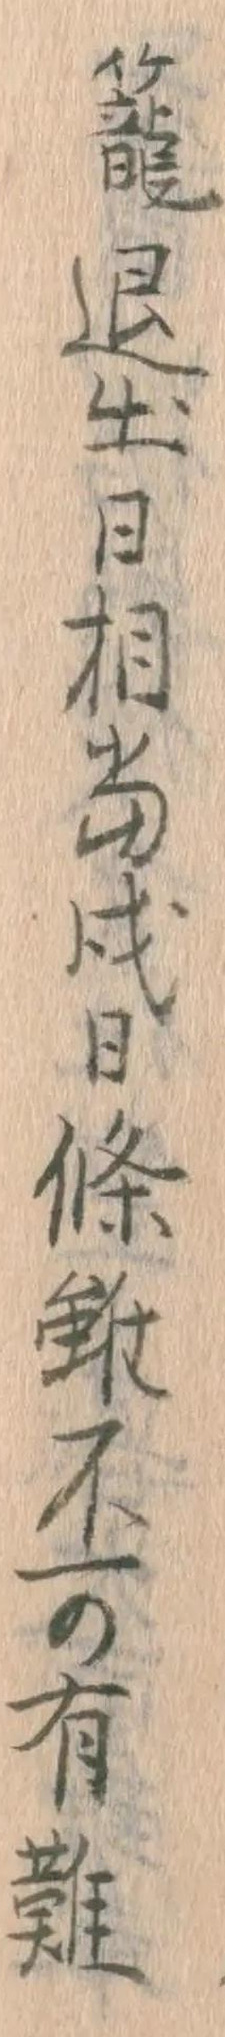籠退出日相当戌日条雖不可有難
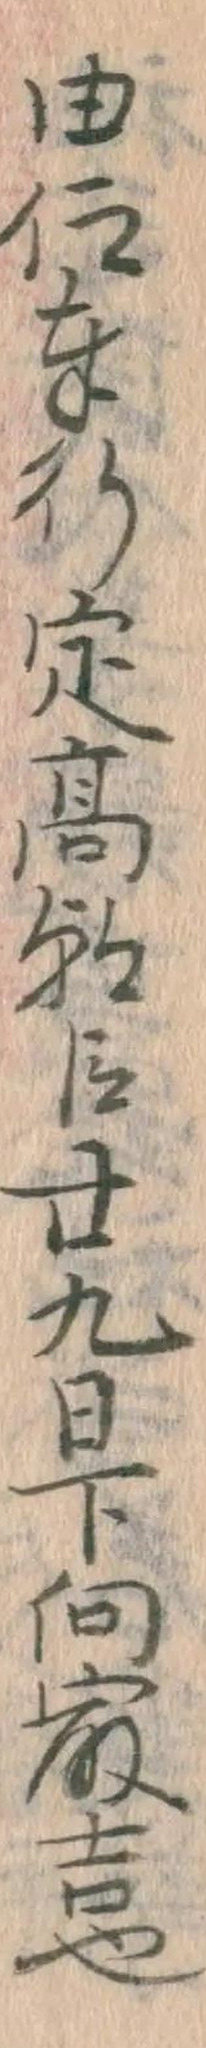由仰奉行定高朝臣廿九日下向最吉也
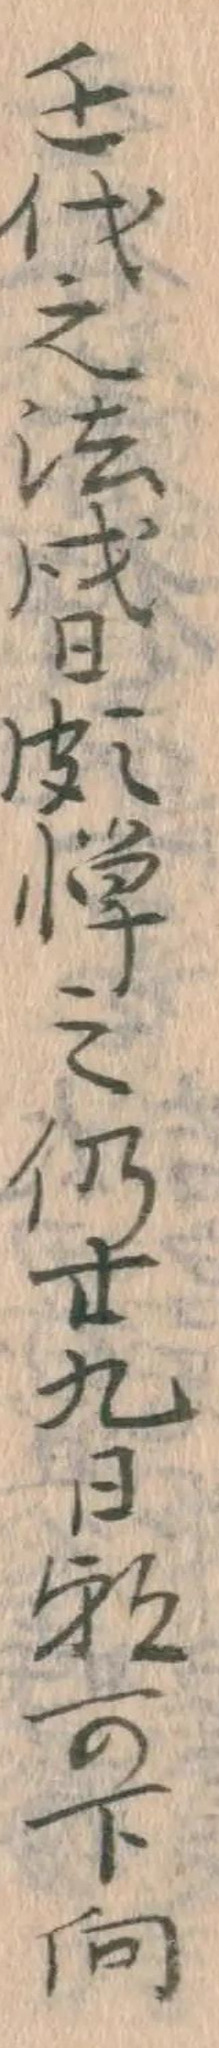近代之法戌日頗憚之仍廿九日朝可下向
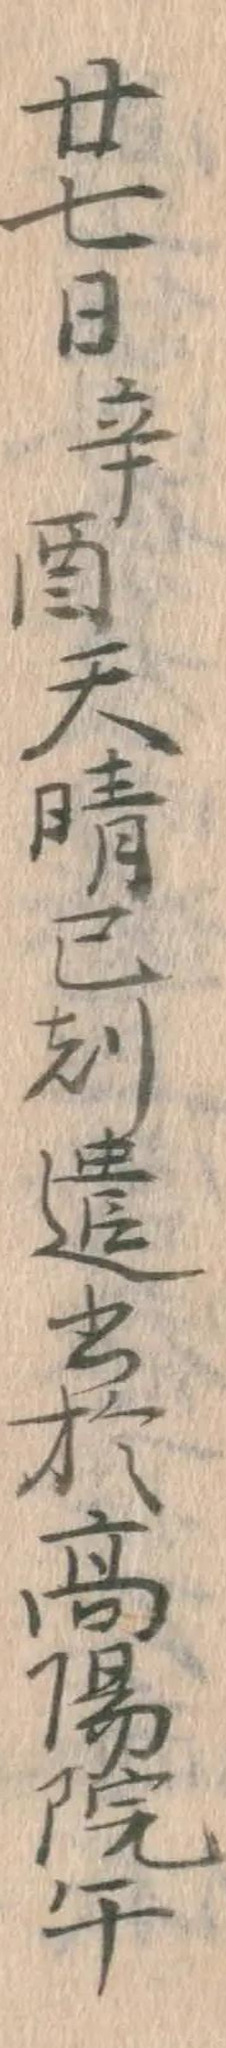廿七日辛酉天晴巳刻遣書於高陽院于
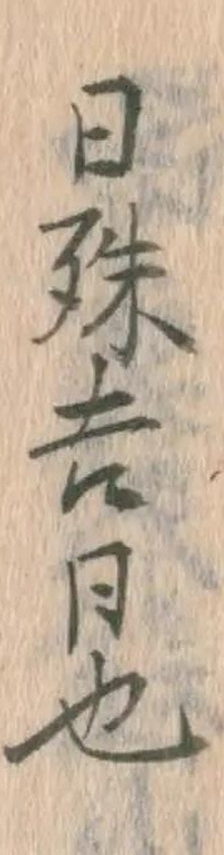日殊吉日也
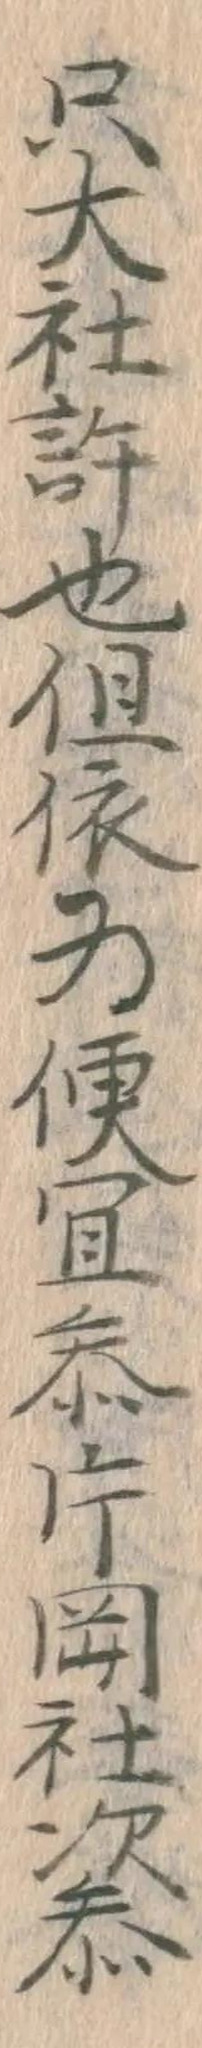只大社許也但依為便宜参片岡社次参
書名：賀茂社記録. 第80冊
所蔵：国立国会図書館 National Diet Library, JAPAN
